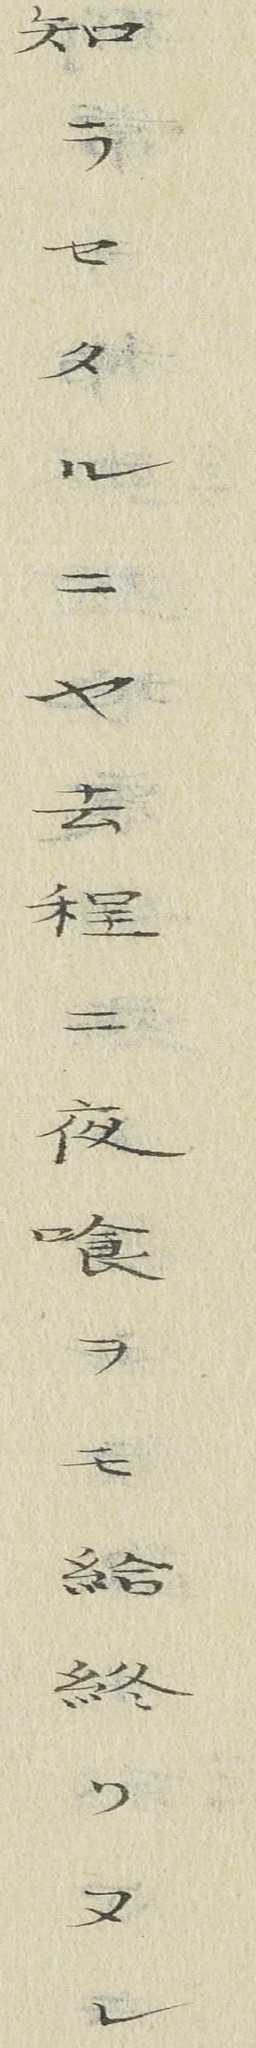知ラセタルニヤ去程ニ夜喰ヲモ給終リヌレ
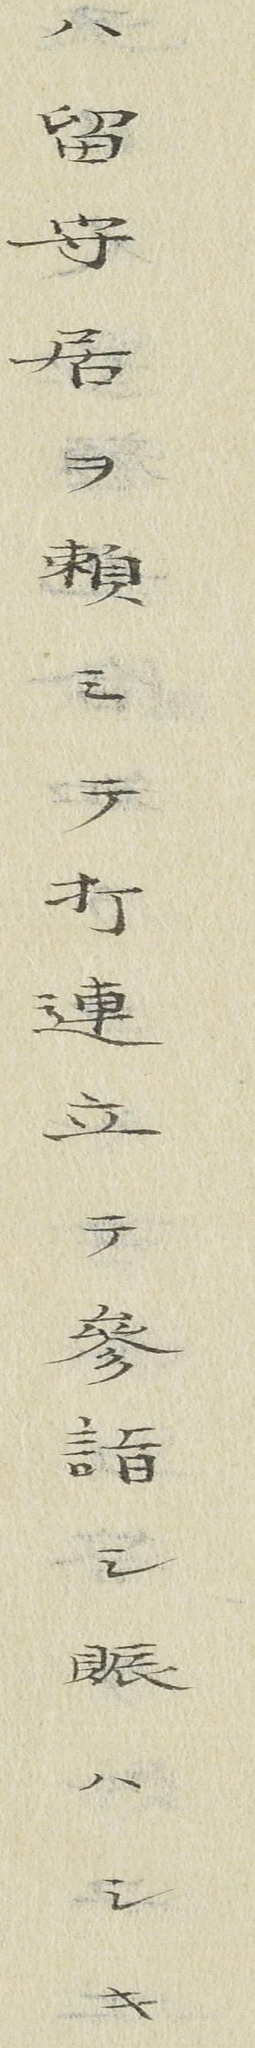ハ留守居ヲ頼ミテ打連立テ参詣シ賑ハシキ
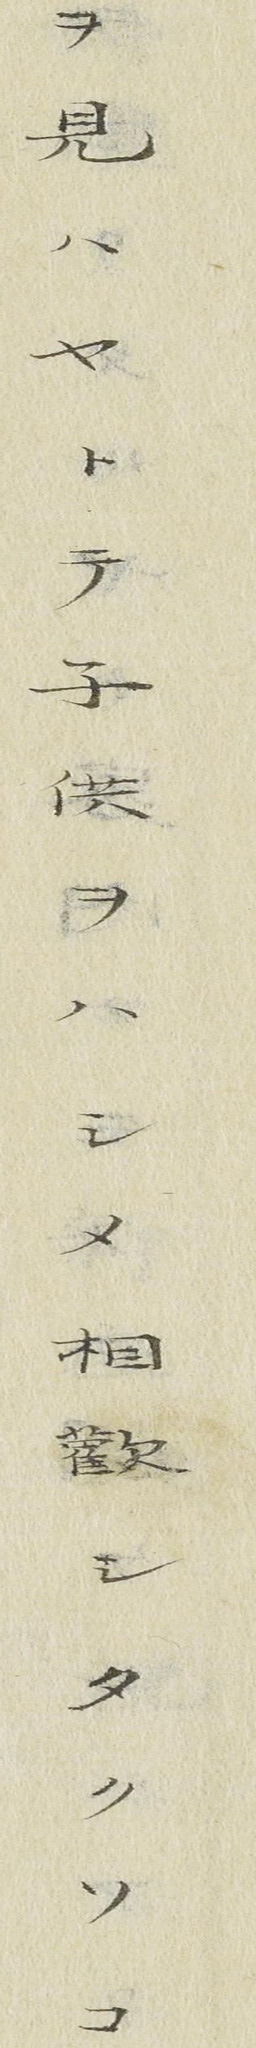ヲ見ハヤトテ子供ヲハシメ相歓シタクソコ
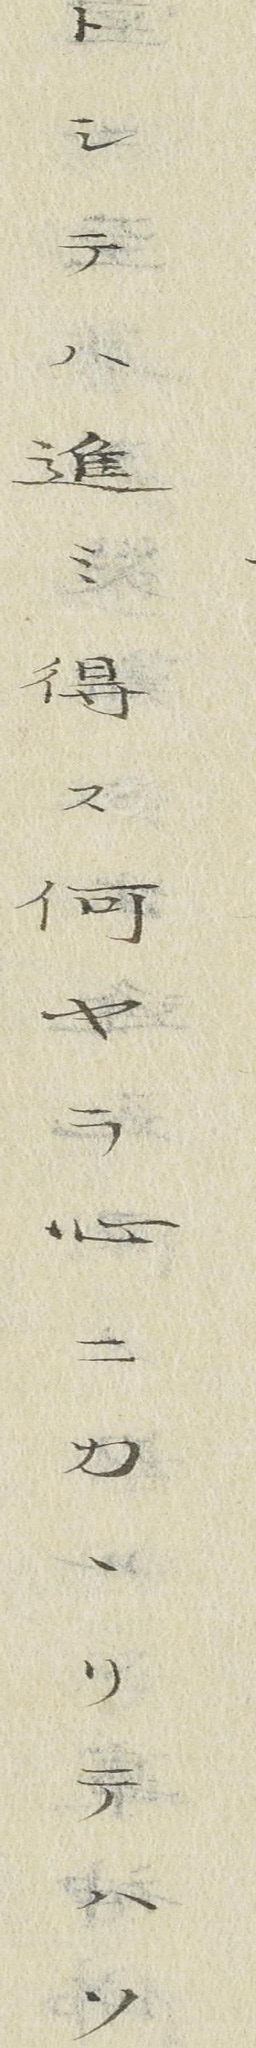トシテハ進ミ得ス何ヤラ心ニカゝリテハソ
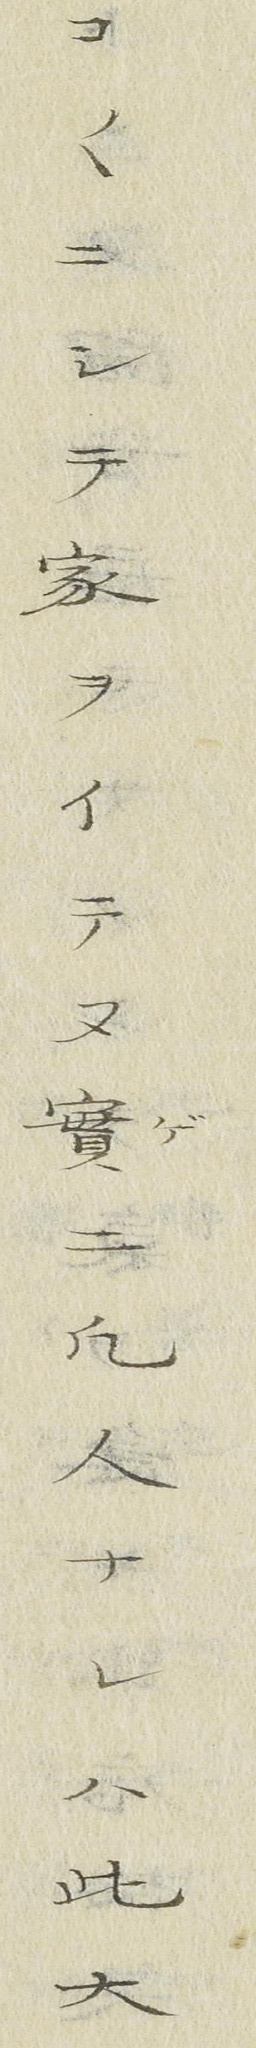コ〳〵ニシテ家ヲイテヌ実ゲニ凡人ナレハ此大
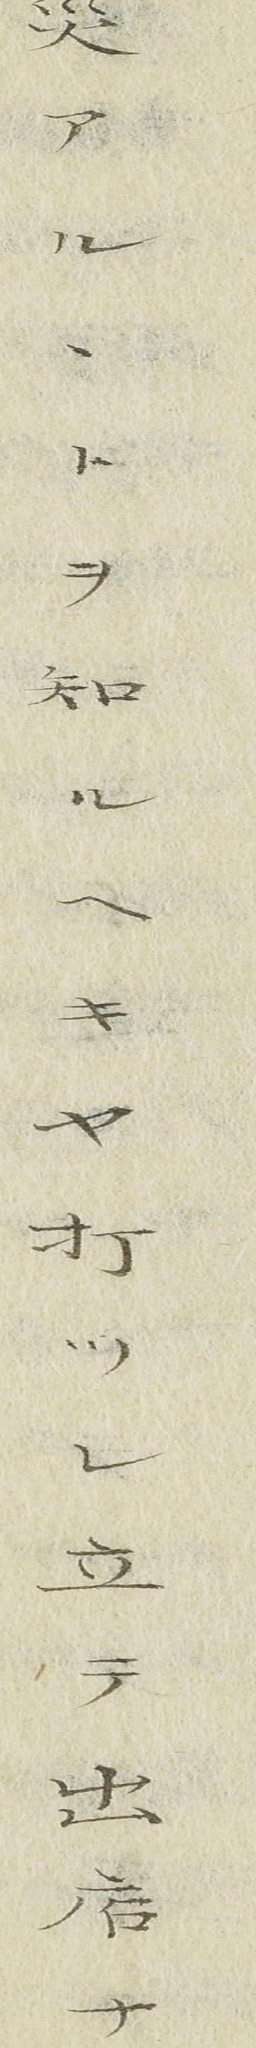災アルゝトヲ知ルヘキヤ打ツレ立テ出店ナ
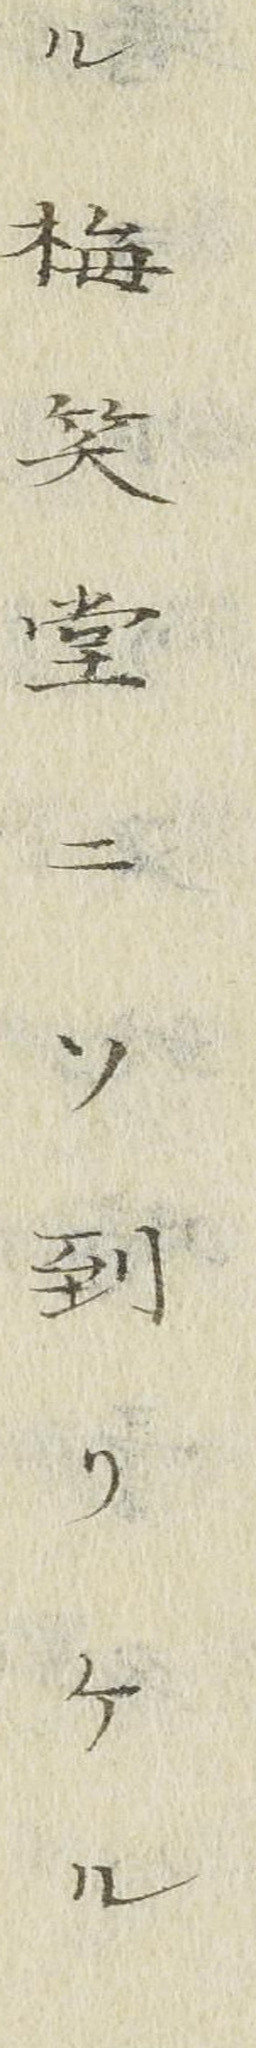ル梅笑堂ニソ到リケル

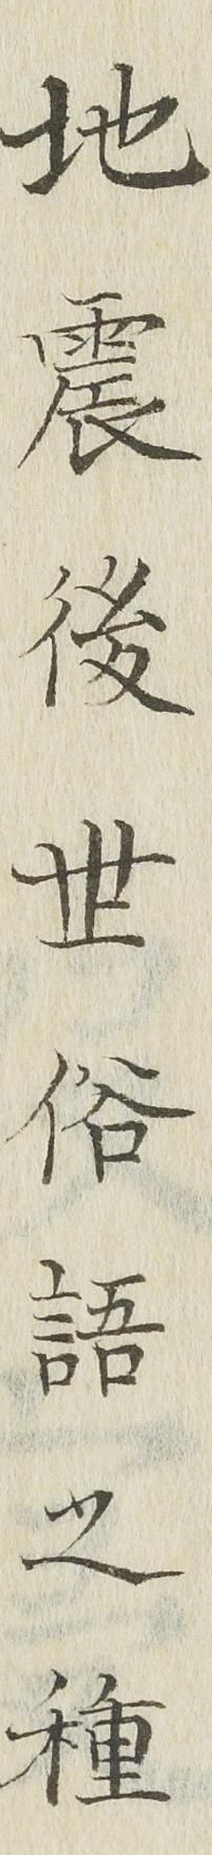地震後世俗語之種

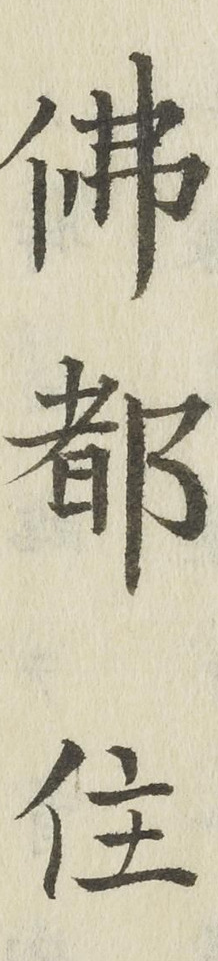仏都住
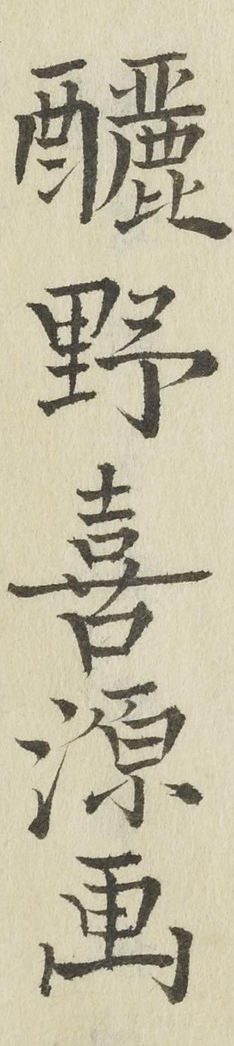釃野喜源画

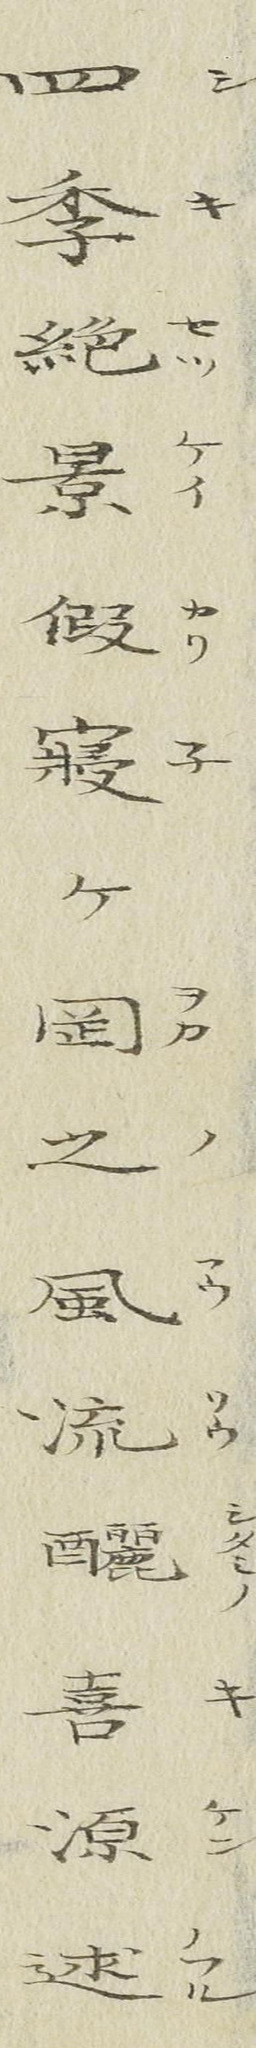四季絶景仮寝ケ岡之風流釃喜源述
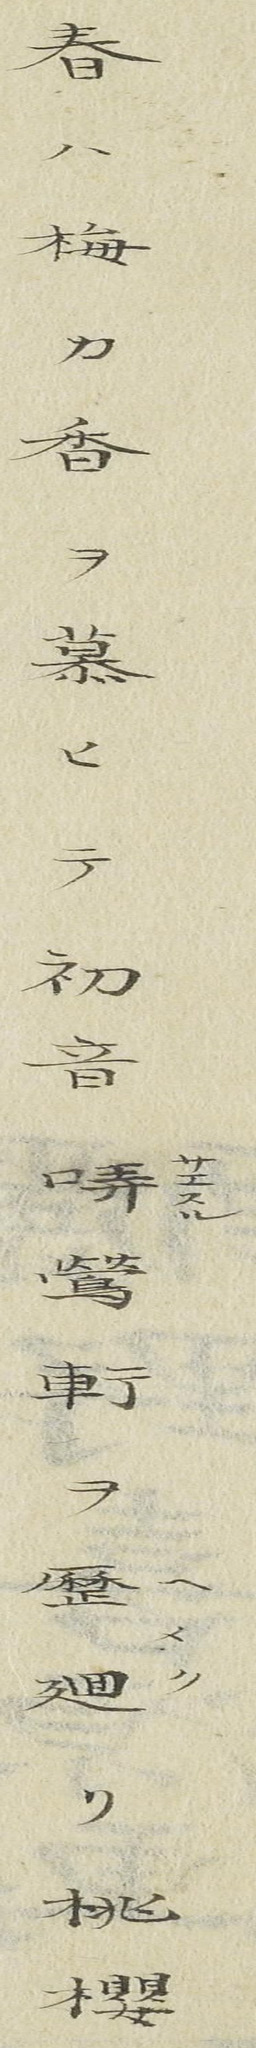春ハ梅カ香ヲ慕ヒテ初音哢鶯軒ヲ歴廻リ桃桜
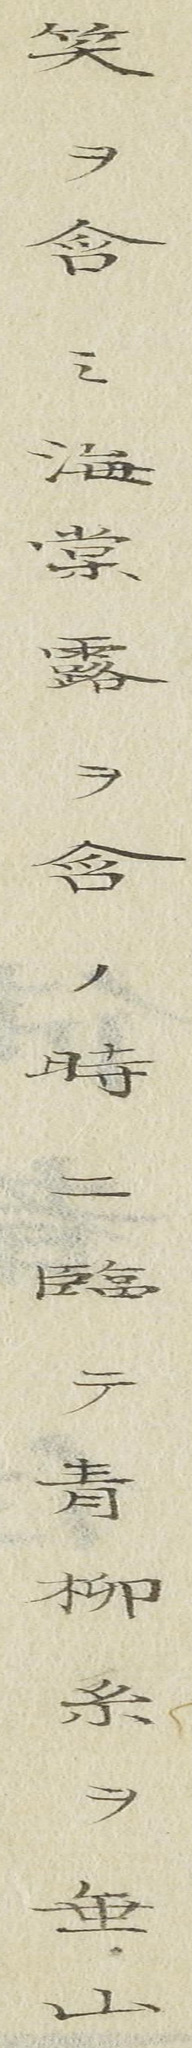笑ヲ含ミ海棠露ヲ含ノ時ニ臨テ青柳糸ヲ垂山
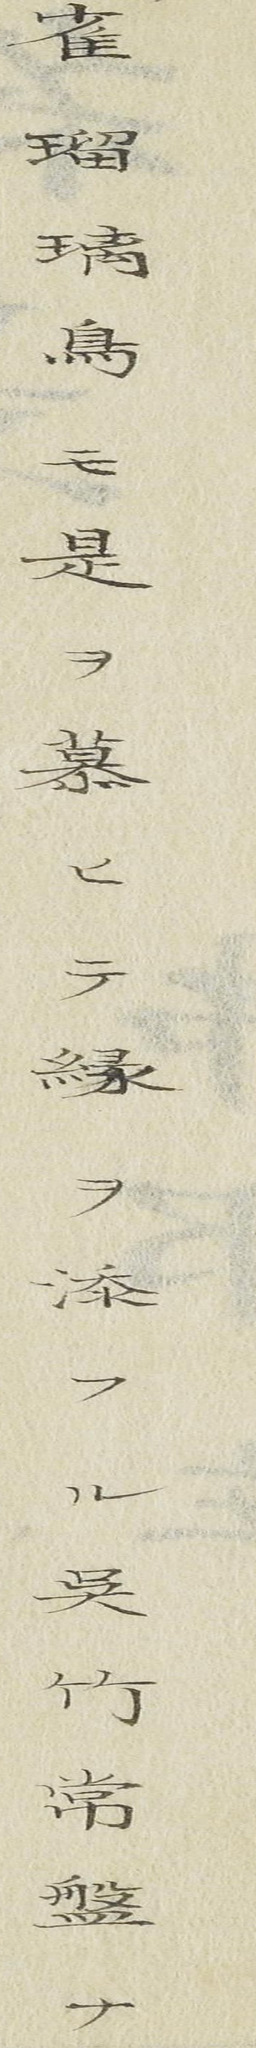雀瑠璃鳥モ是ヲ慕ヒテ緑ヲ添フル呉竹常盤ナ
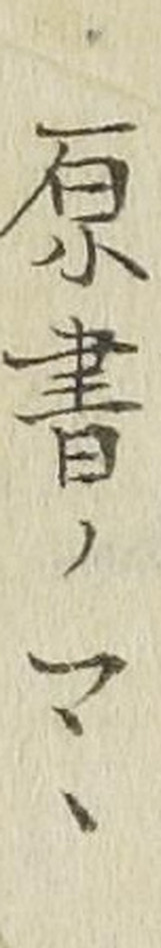原書ノマヽ
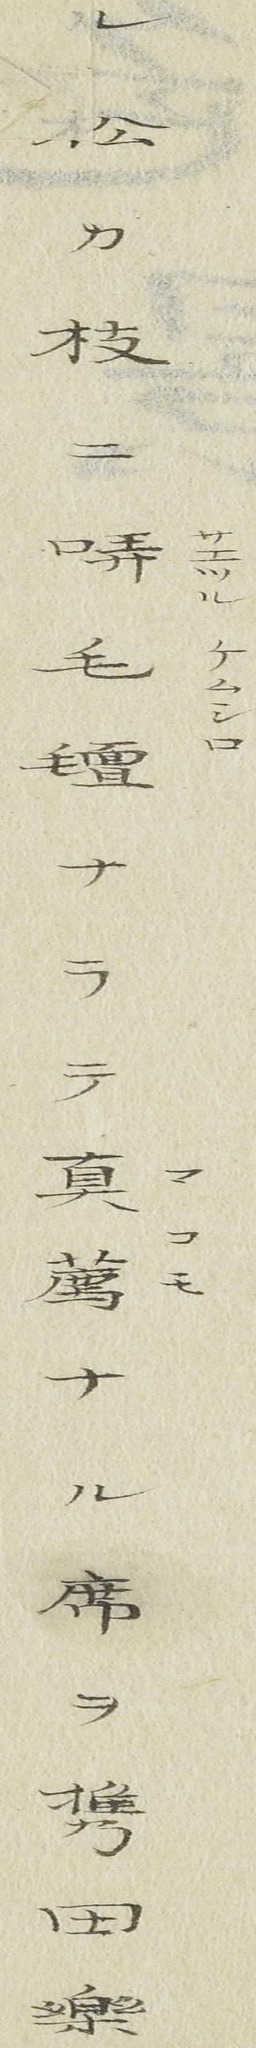ル松カ枝ニ哢毛氈ナラテ真薦ナル席ヲ携田楽
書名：地災撮要　地震之部　巻ノ二
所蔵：東京大学地震研究所図書室 Earthquake Research Institute Library, The University of Tokyo, JAPAN
